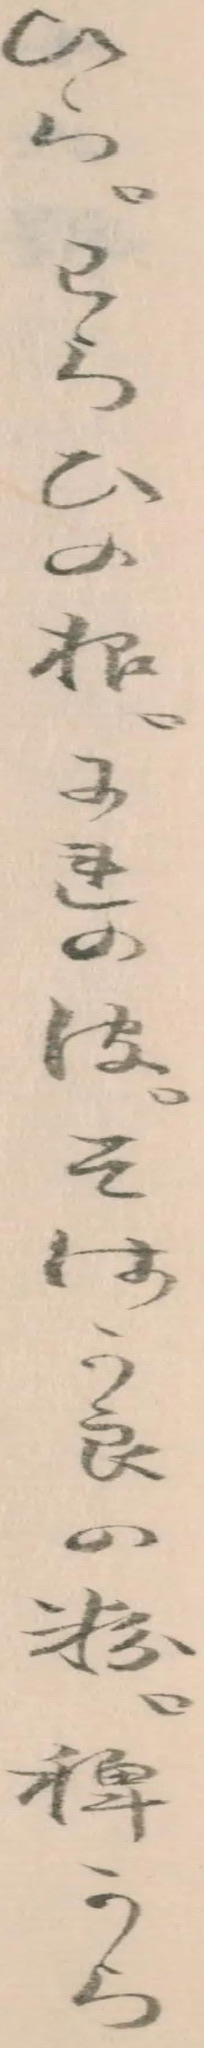ひら。わらひの根。にれのは。そはからの粉。稗から
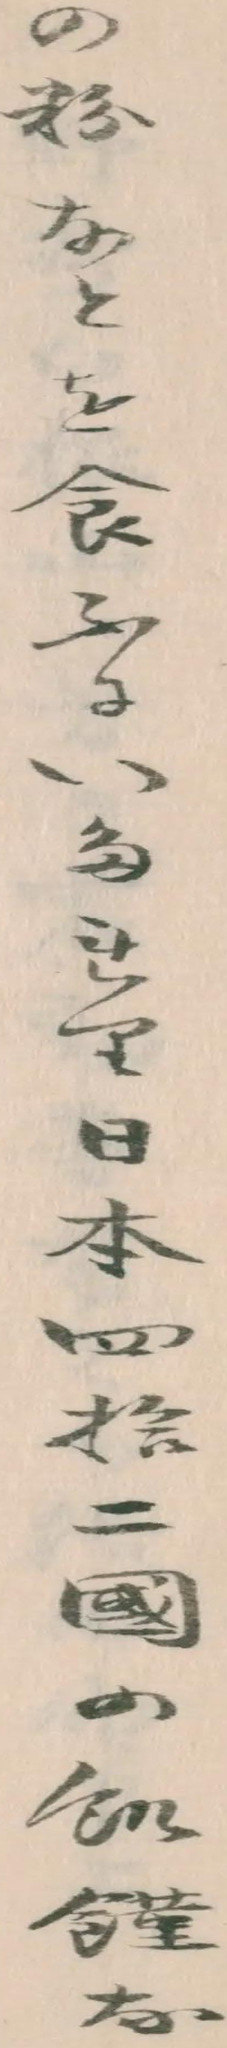の粉なとを食ふにいたれり日本四拾二国の飢饉な
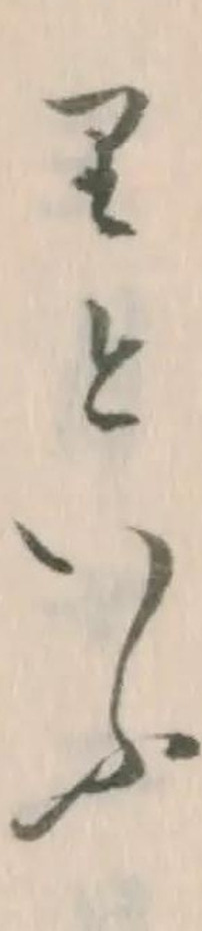りといふ

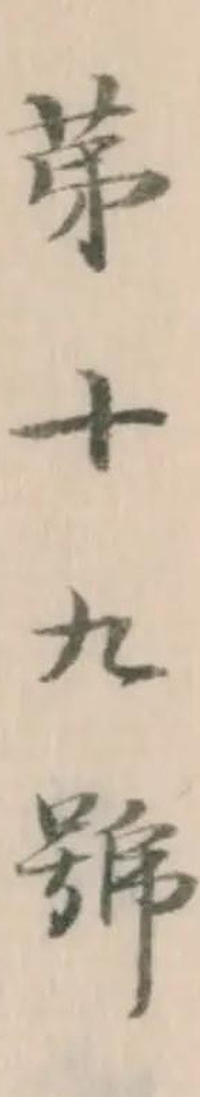第十九号
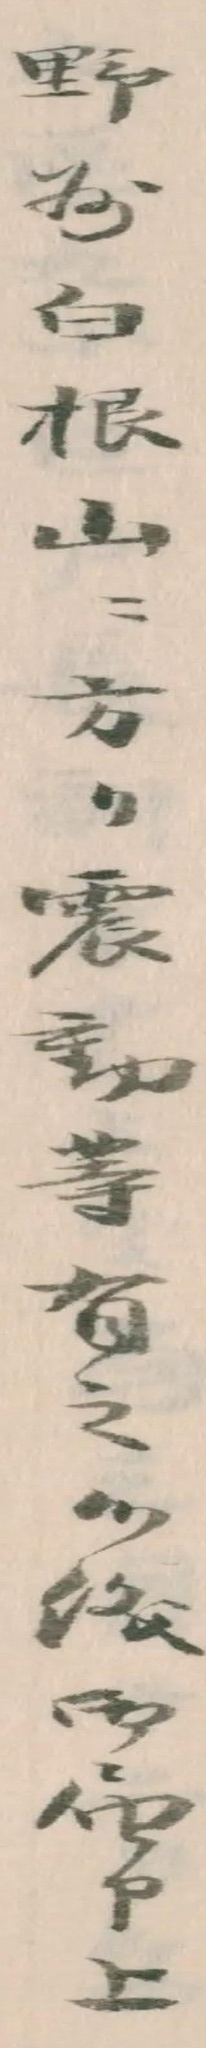野州白根山ニ方リ振動等有之候儀御届申上
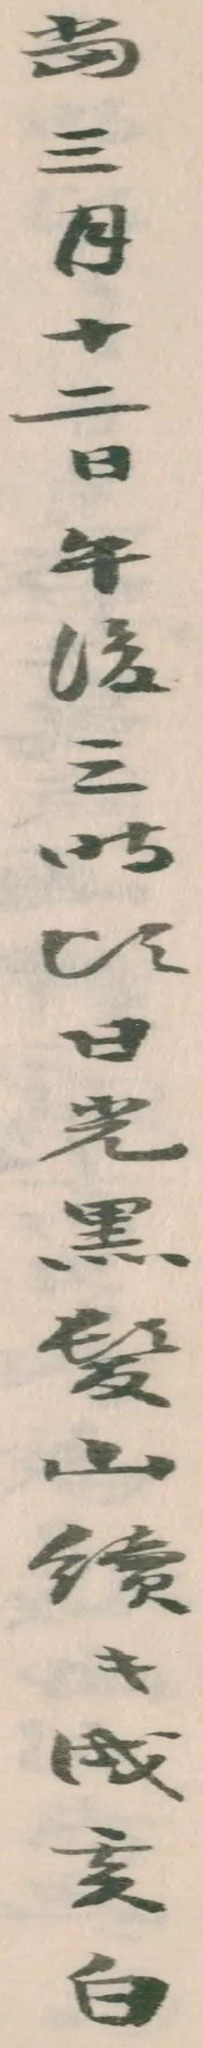当三月十二日午後三時頃日光黒髪山続キ成其白
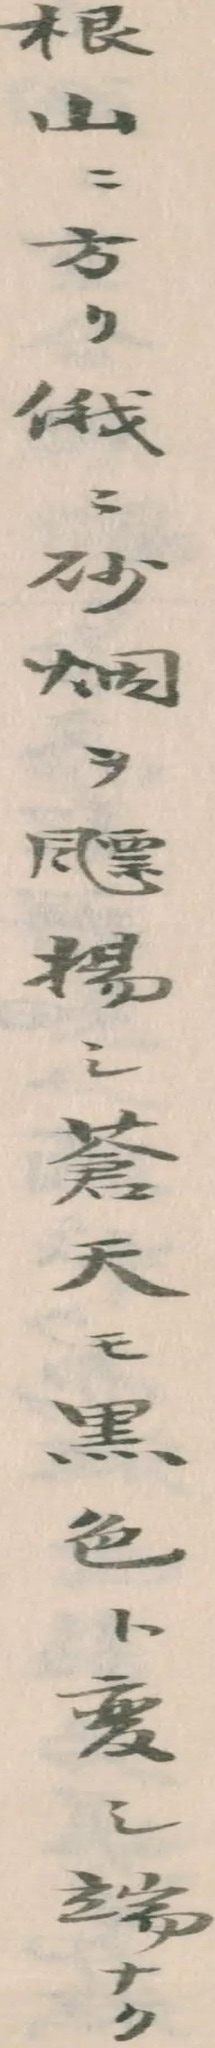根山ニ方リ俄ニ砂烟ヲ瓢揚シ蒼天モ黒色ト変シ端ナク
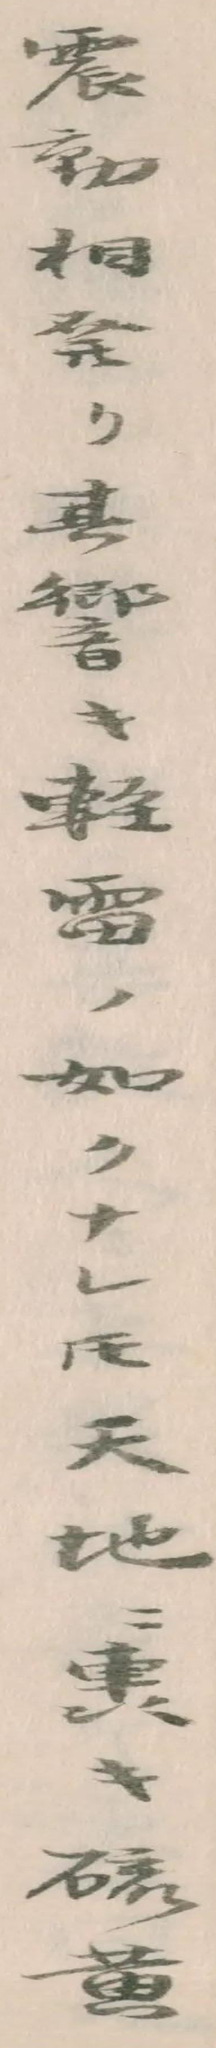振動相発リ其響キ軽雷ノ如クナレトモ天地ニ轟キ硫黄
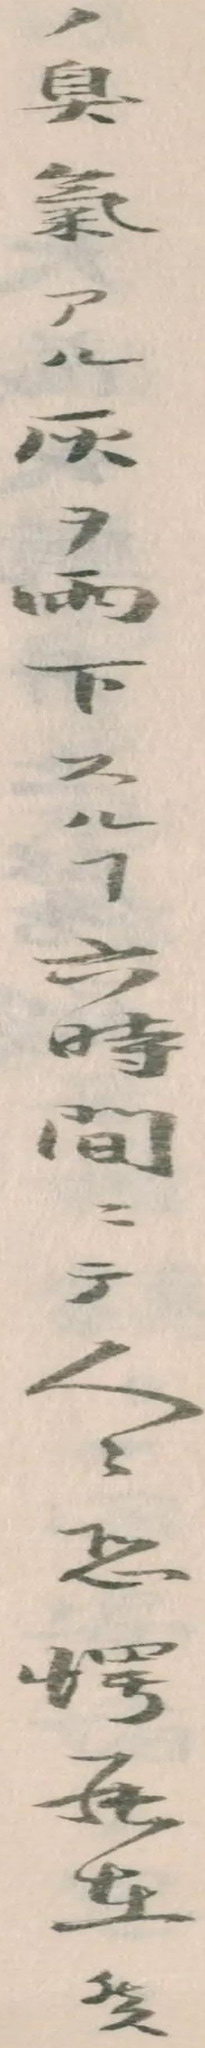ノ臭気アル灰ヲ雨下スルコト六時間ニテ人々驚愕屈在候
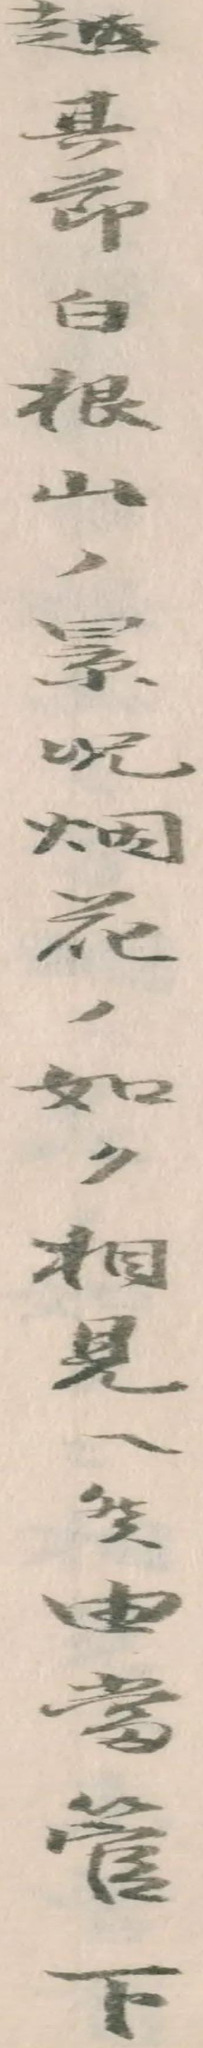越其節白根山ノ景況烟花ノ如ク相見ヘ候由当管下
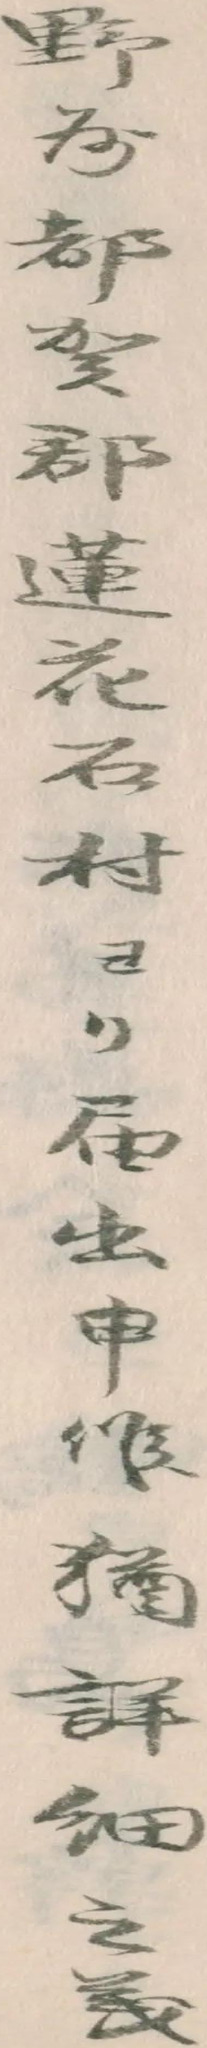野州都賀郡蓮花石村ヨリ届出申候猶詳細之義
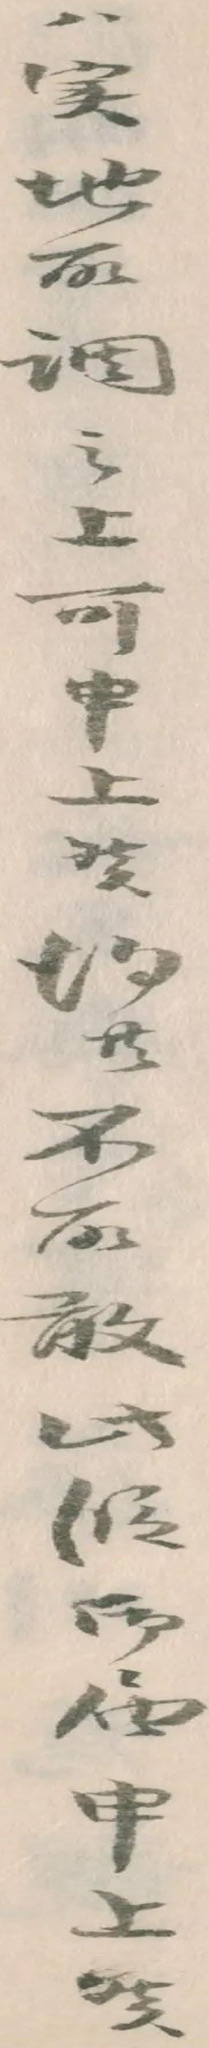ハ実地取調之上可申上候得共不取敢此段御届申上候

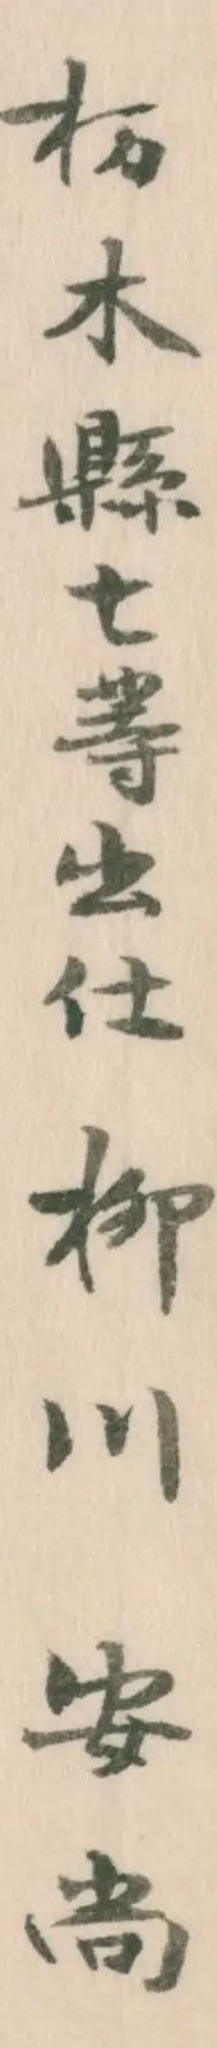栃木県七等出仕柳川安尚
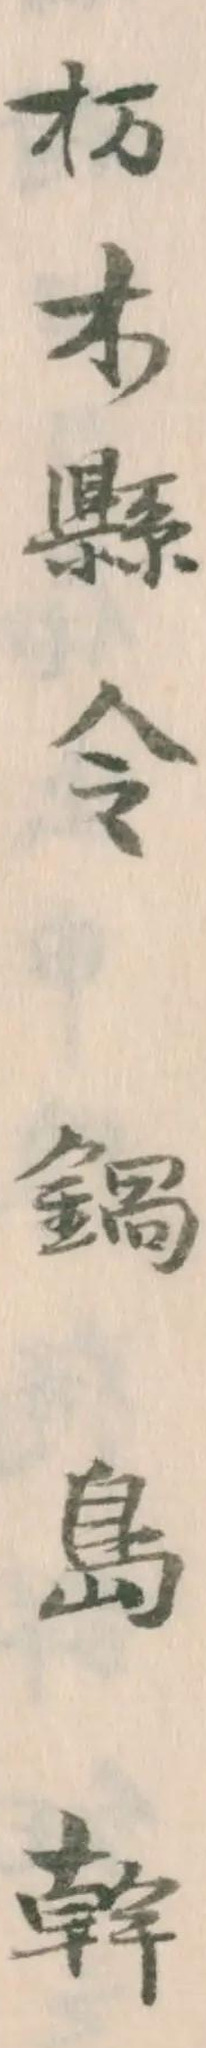栃木県令鍋島幹
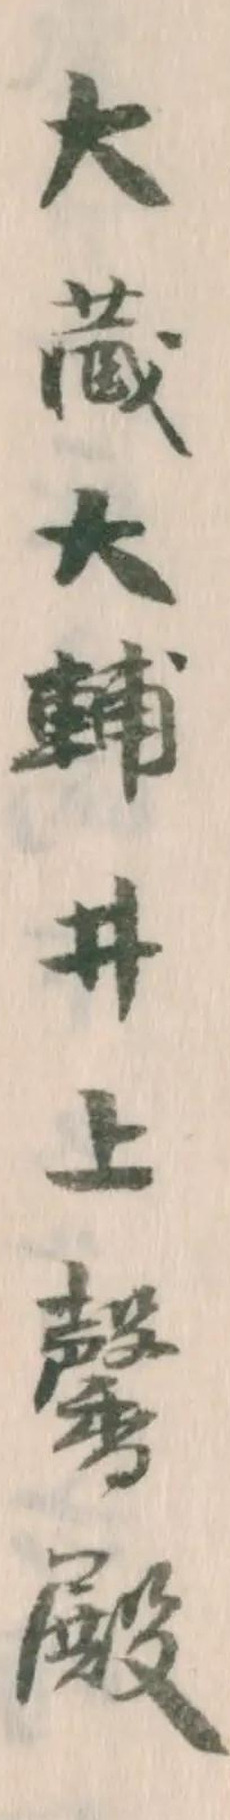大蔵大輔井上馨殿
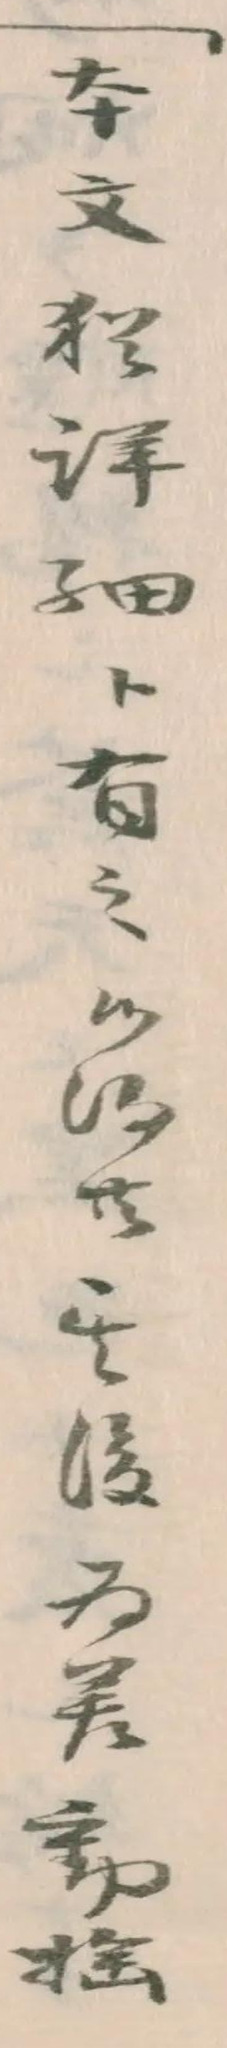本文猶詳細ト有之候得共其後為差動揺
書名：地災撮要. 巻11-12(地震之部)
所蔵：国立国会図書館 National Diet Library, JAPAN
